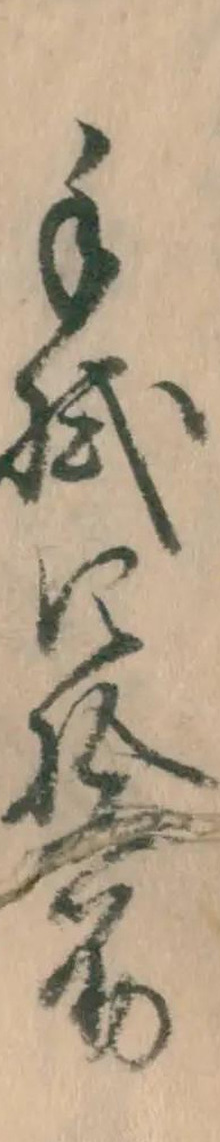一手拭四拾筋
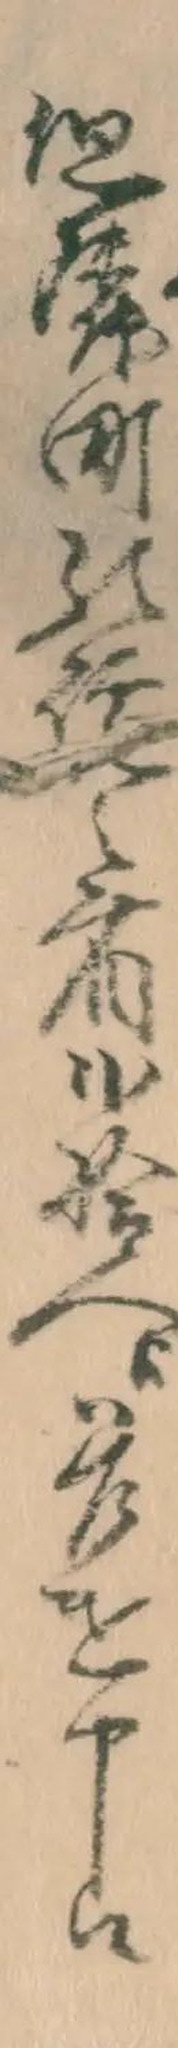但隣町類焼之者弐拾人え差遣申候
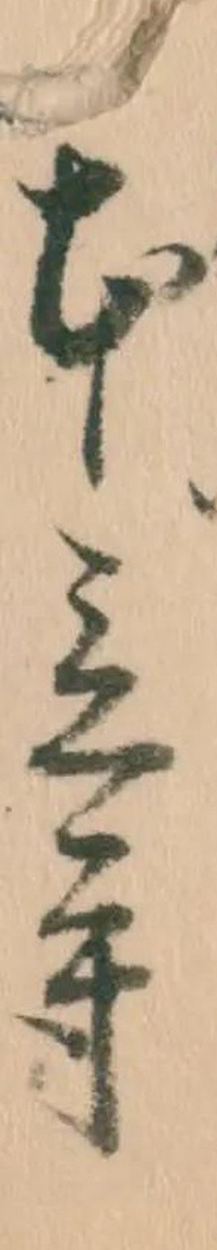本立寺
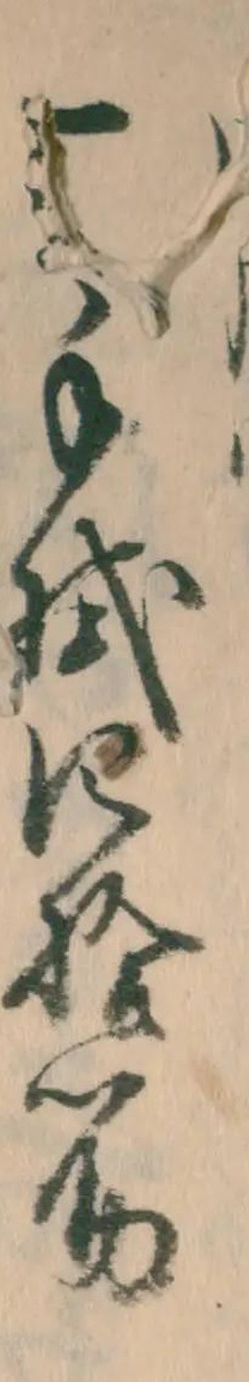一手拭四拾筋
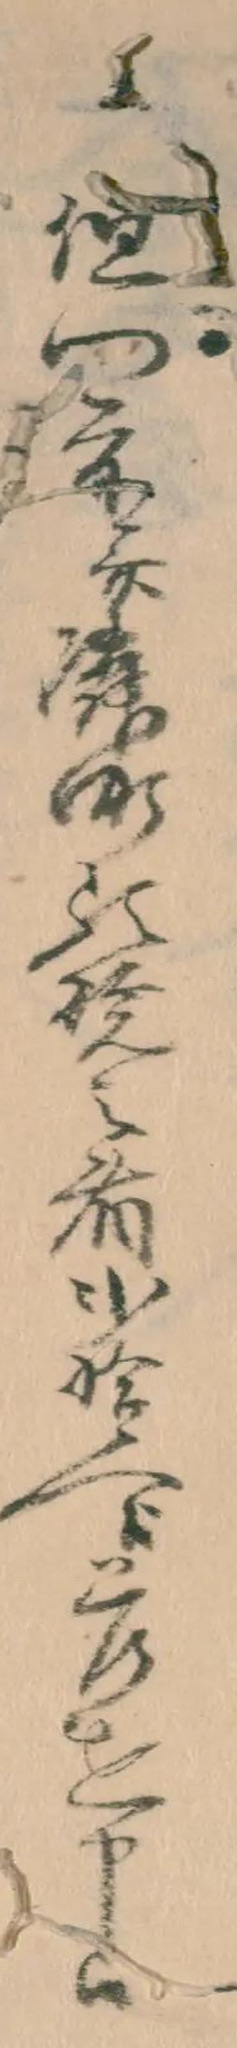但門前并隣町類焼之者弐拾人え差遣申候
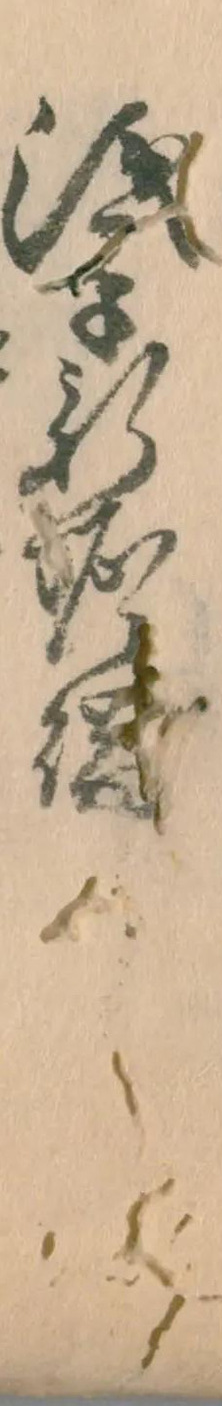浅草新堀端
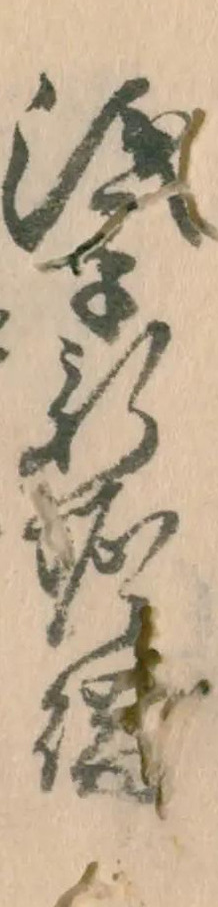浅草新堀端
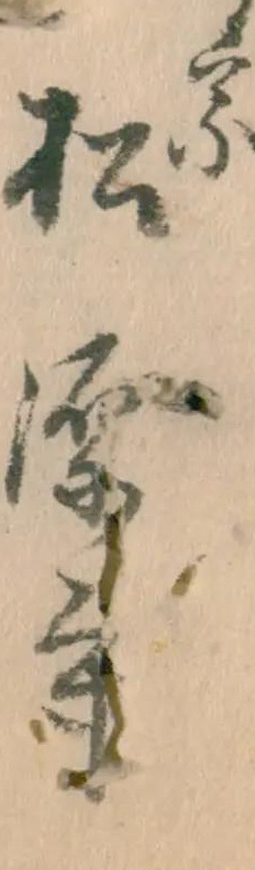松源寺

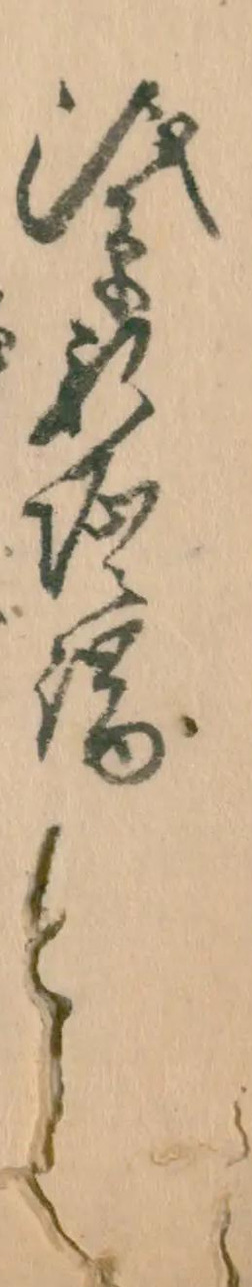浅草新堀端
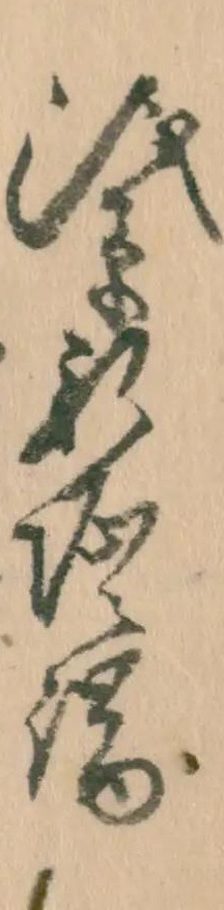浅草新堀端
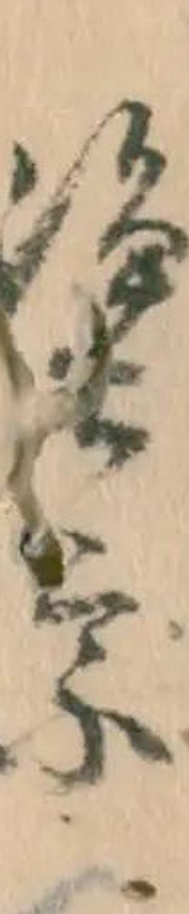浄土宗
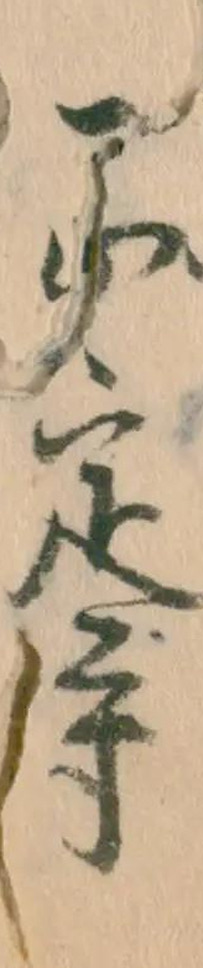正定寺
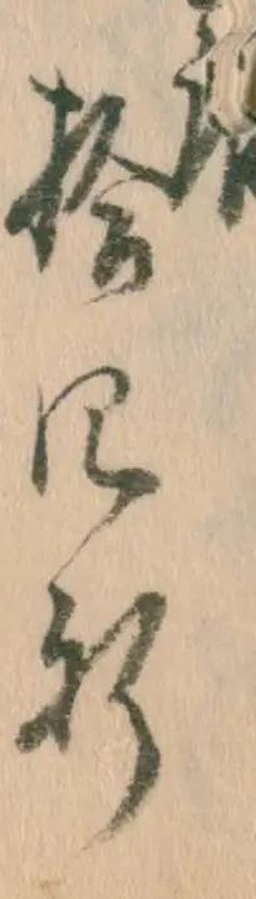拾五軒
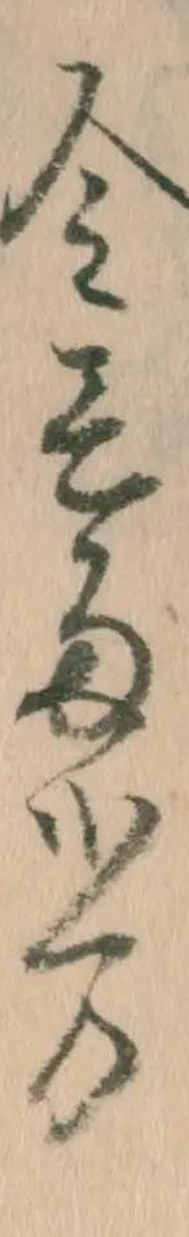金壱両弐分
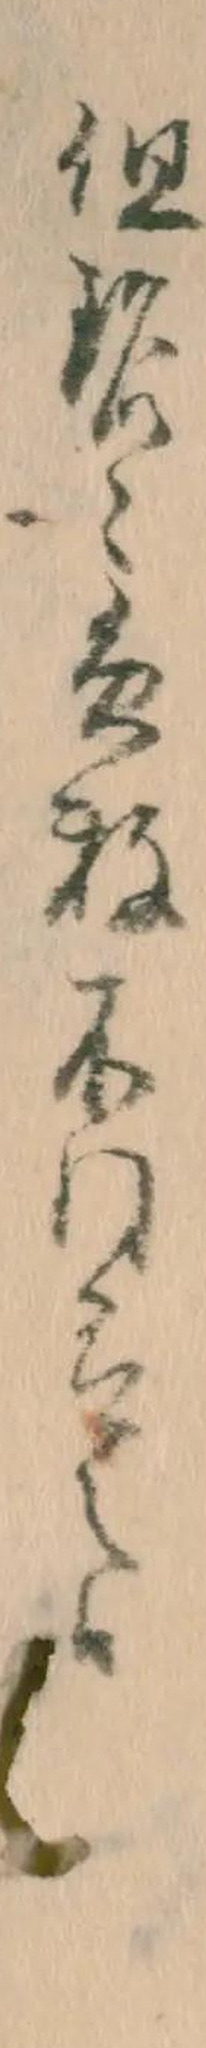但銘々員数不同有之候
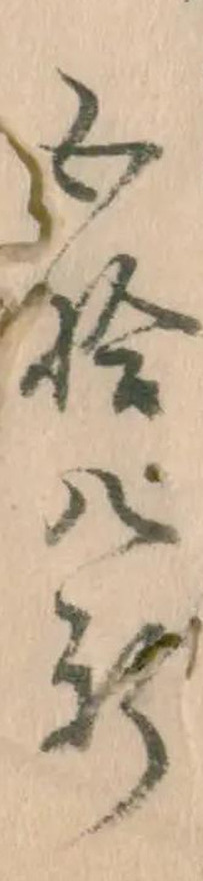五拾八軒
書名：武家方并寺院等ニテ施差出候一件
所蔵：国立国会図書館 National Diet Library, JAPAN
